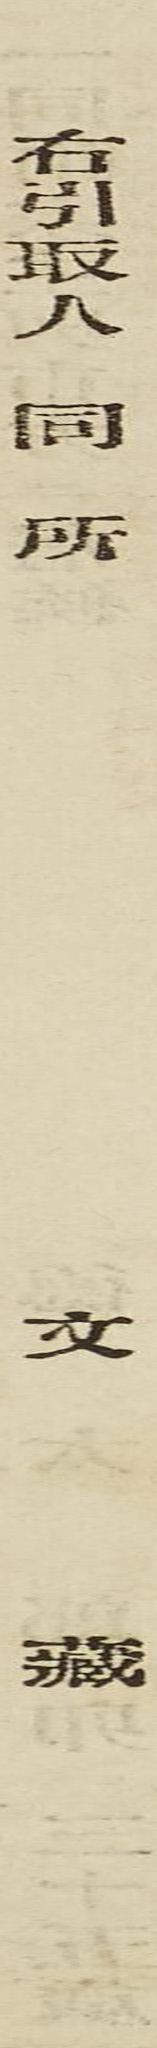右引取人同所文藏
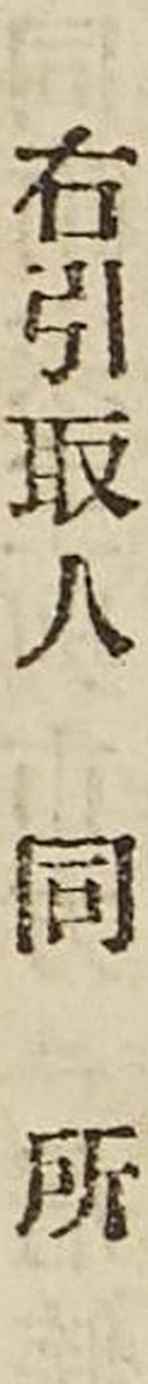右引取人同同
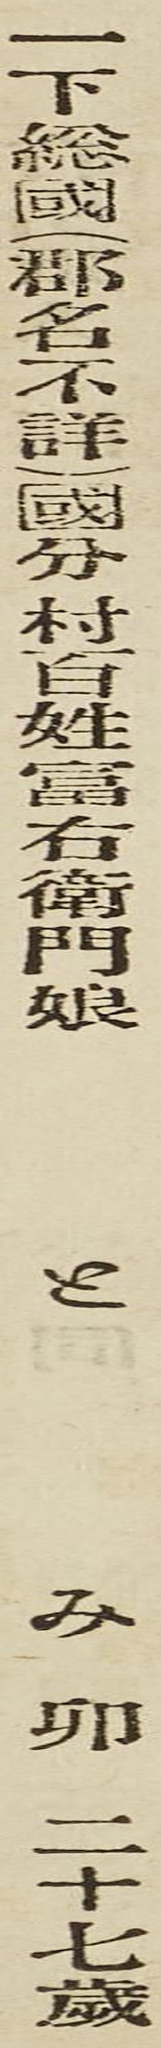一下総国国分村百姓富右衛門娘とみ卯二十七歳
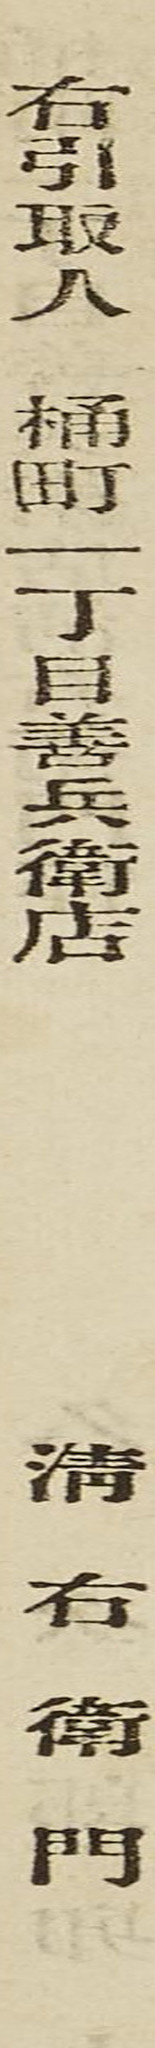右引取人桶町一丁目善兵衛店清右衛門

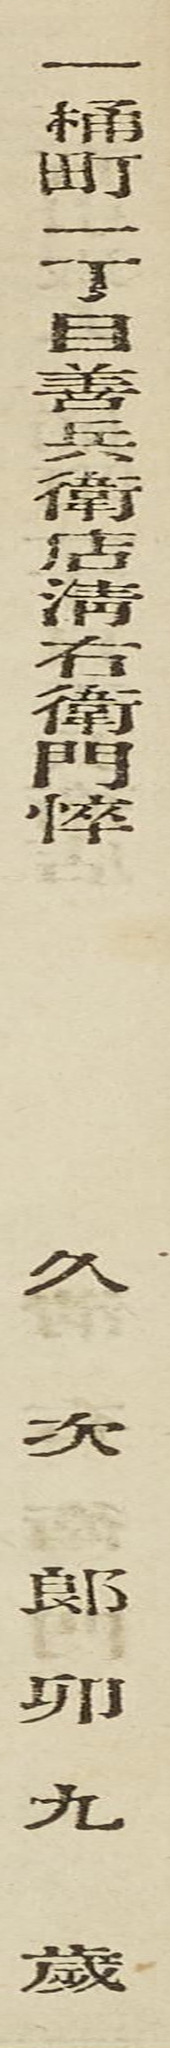一桶町一丁目善兵衛店清右衛門倅久次郎卯九歳
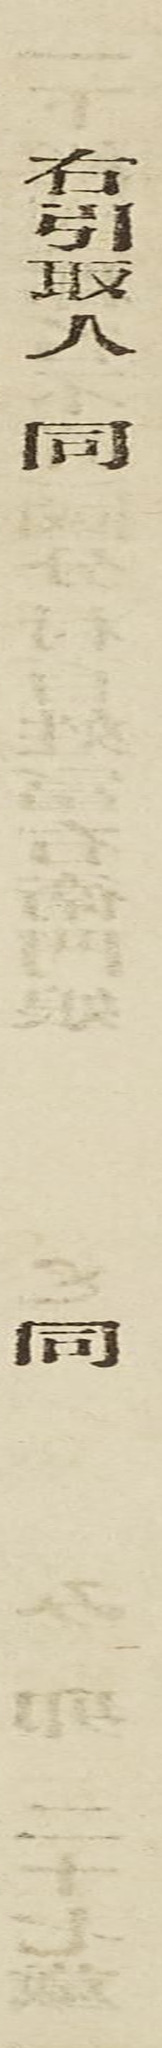右引取人同同
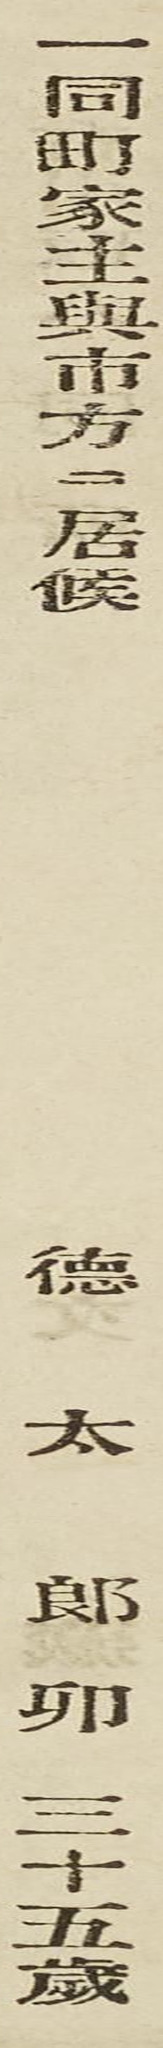一同町家主與市方ニ居候徳太郎卯三十五歳
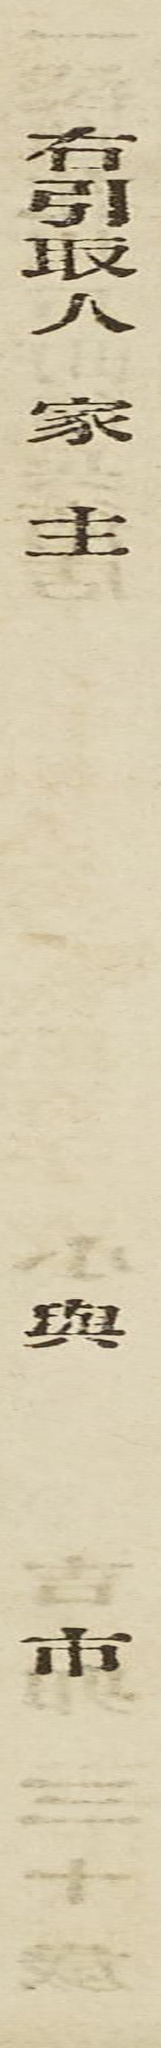右引取人家主與市
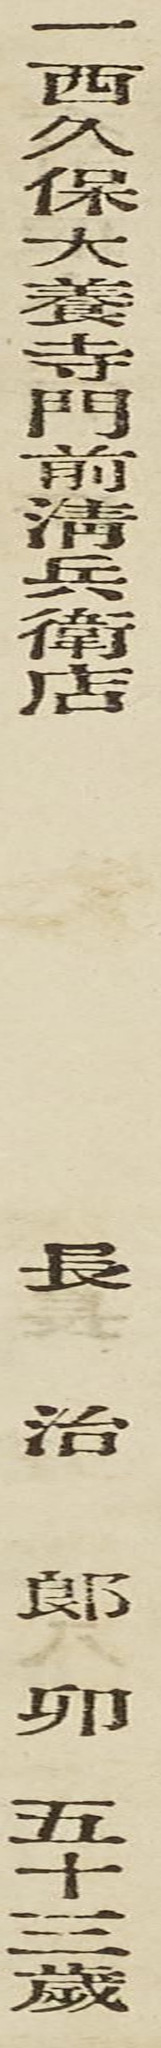一西久保大養寺門前清兵衛店長治郎卯五十三歳
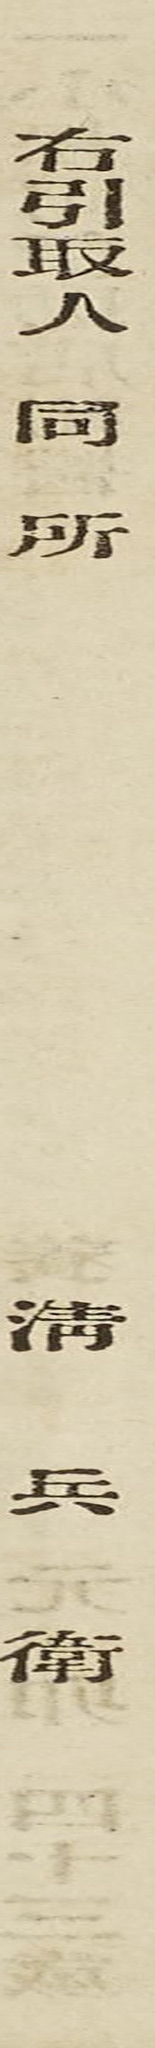右引取人同所清兵衛
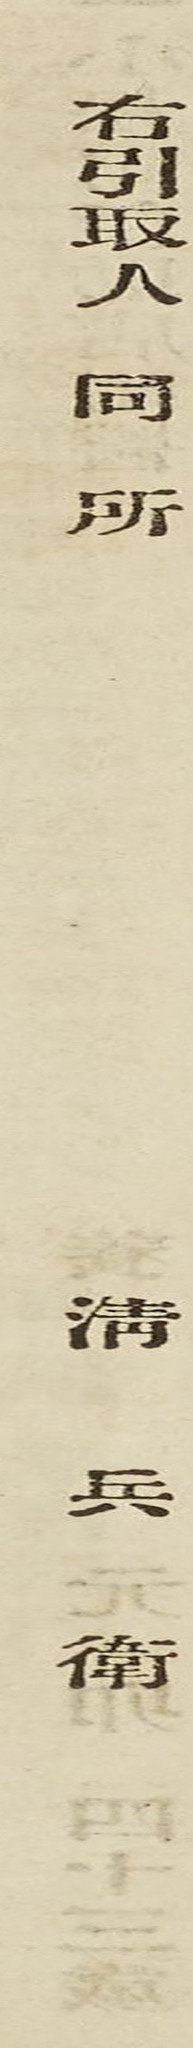右引取人同所清兵衛
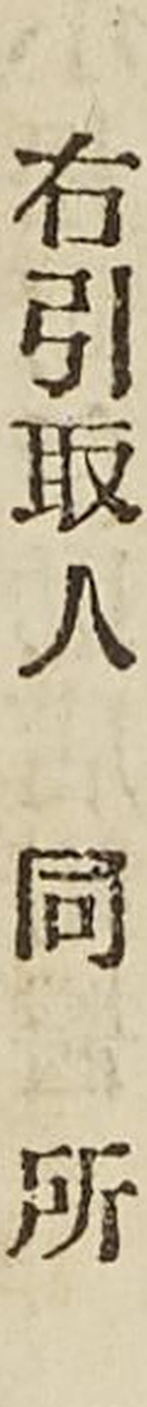右引取人同同
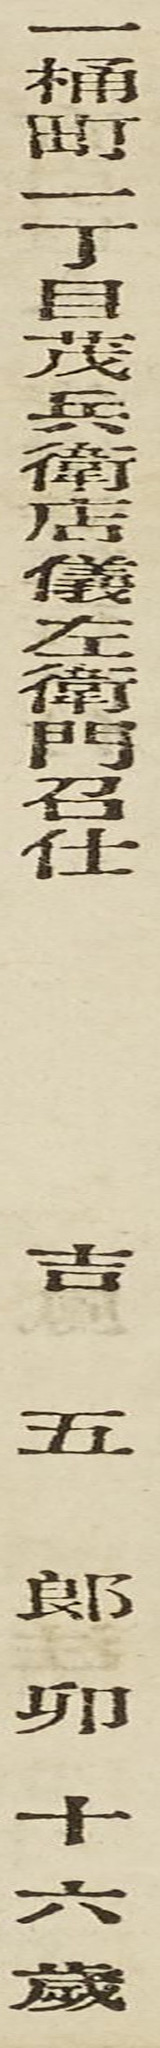一桶町一丁目茂兵衛店儀左衛門召仕吉五郎卯十六歳
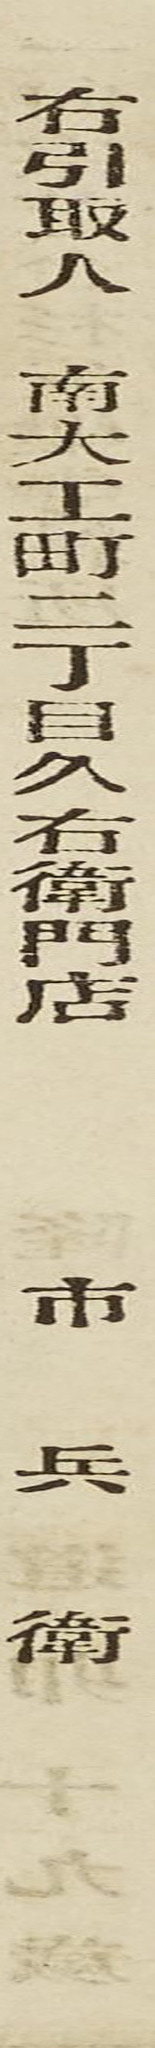右引取人南大工町二丁目久右衛門店市兵衛
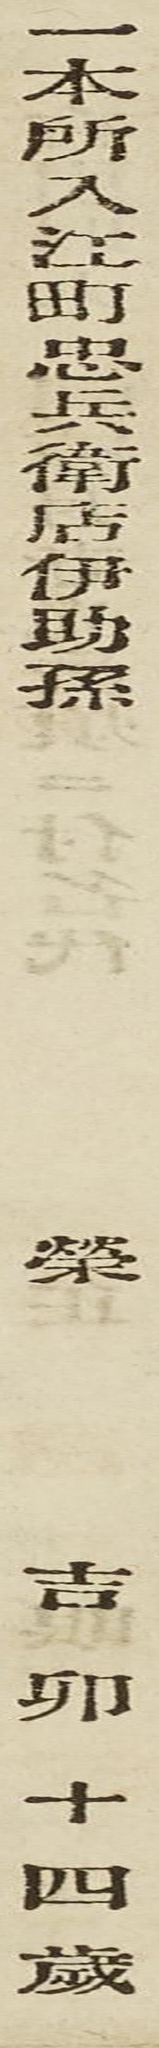一本所入江町忠兵衛店伊助孫栄吉卯十四歳
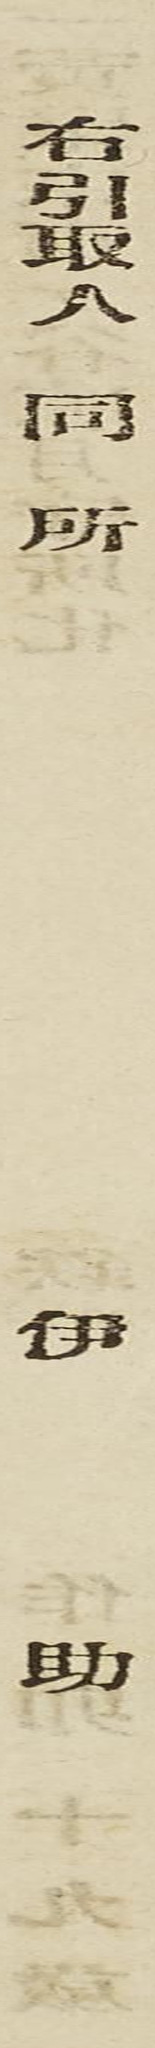右引取人同所伊助
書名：永代惨話　文化の夢　全
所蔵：東京大学地震研究所図書室 Earthquake Research Institute Library, The University of Tokyo, JAPAN
